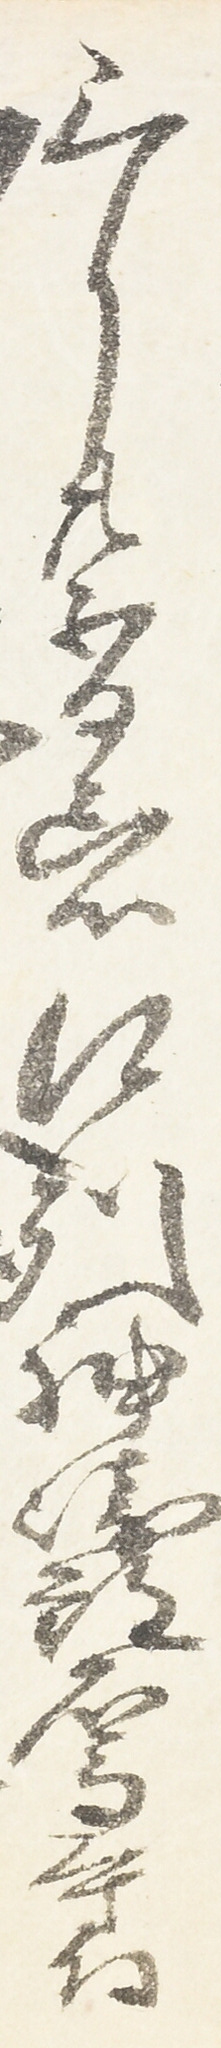三月廿五日着江州神崎郡石馬寺村
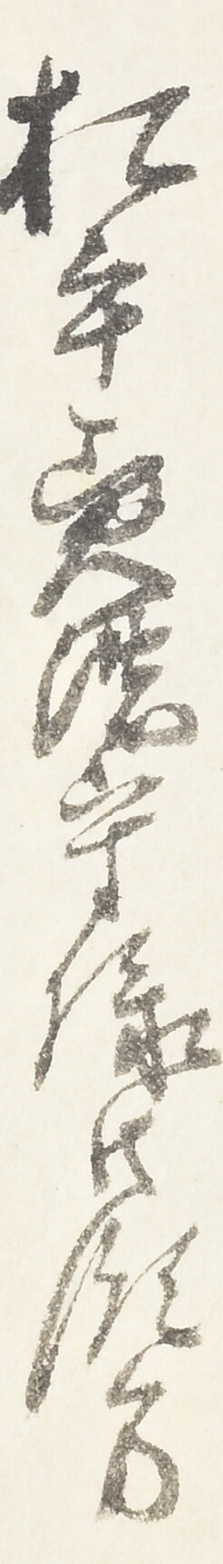松平美濃守様御領分
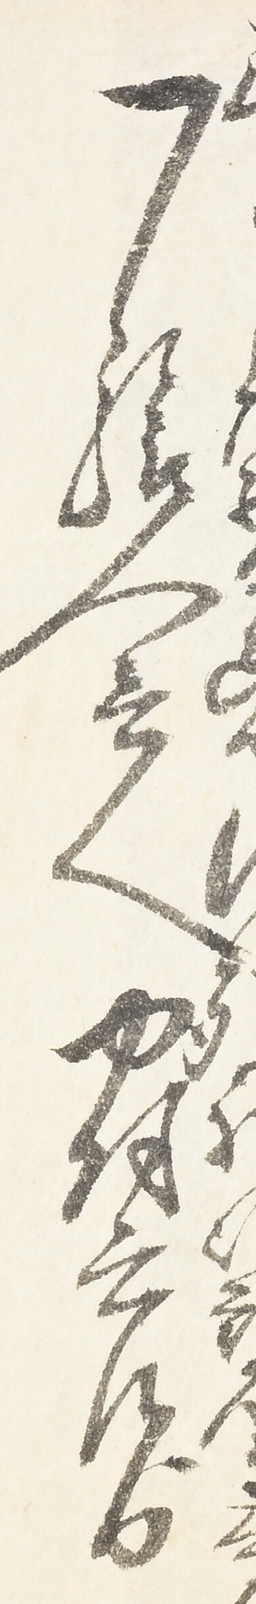一旅人壱人中村兵左衛門
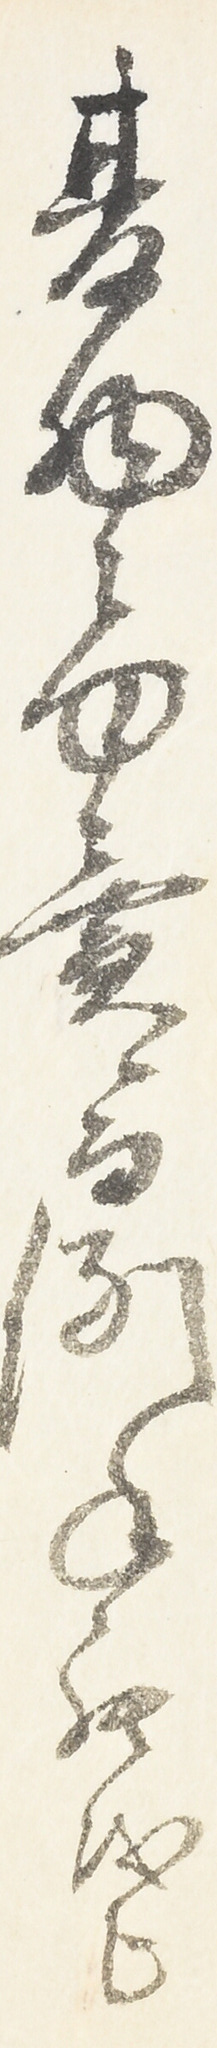夏物商売ニ而例年罷越申候
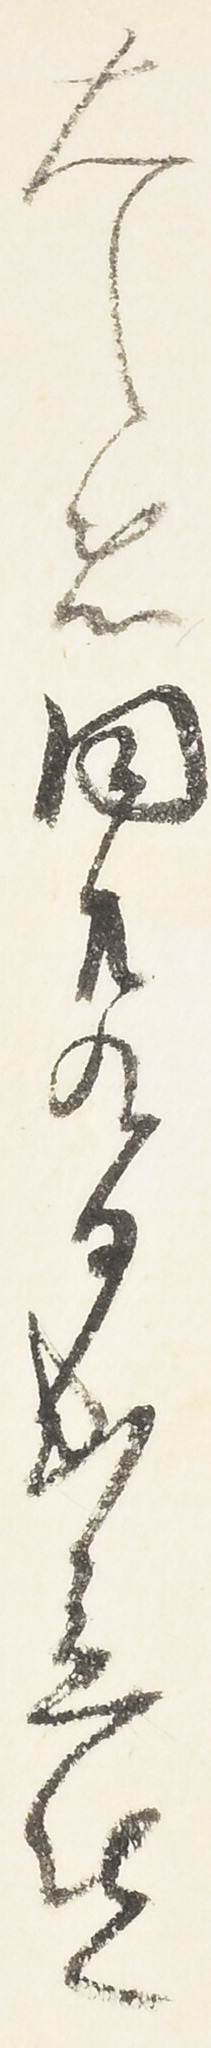右之者同廿九日出立仕候
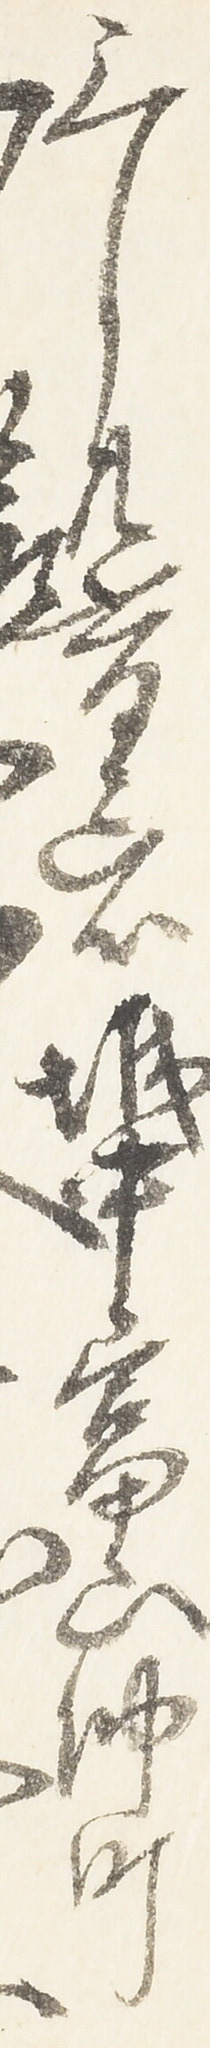三月廿六日着越中富山仲町
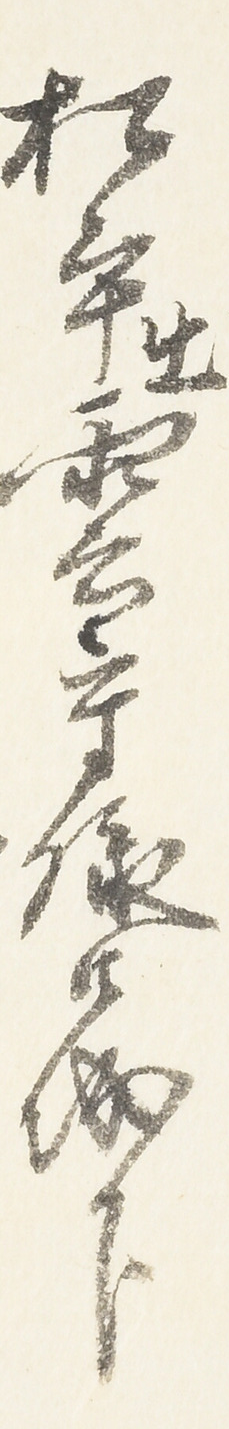松平雲守様御城下
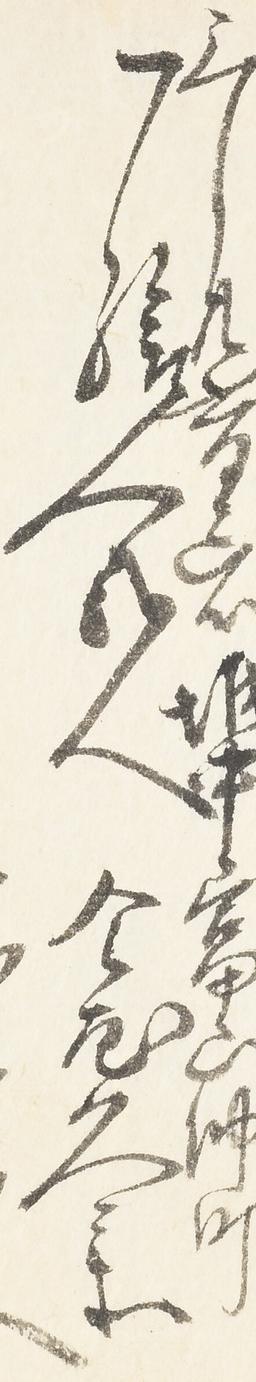一旅人弐人金屋久兵衛
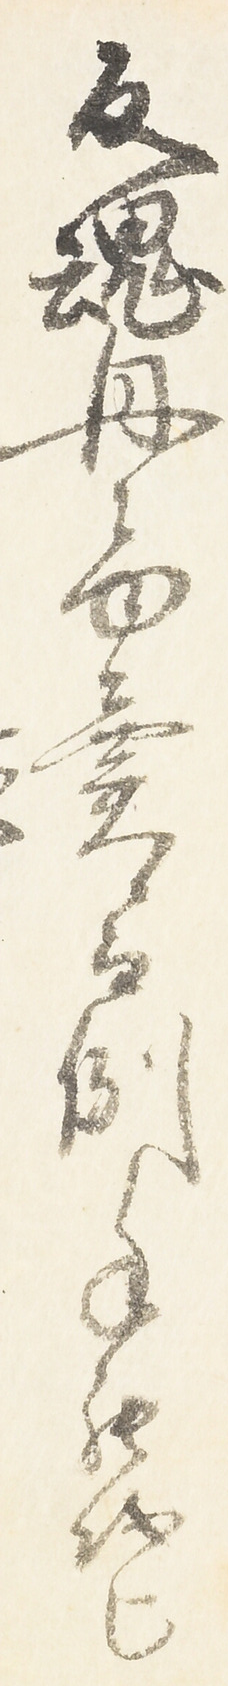反魂丹商売ニ而例年罷越申候
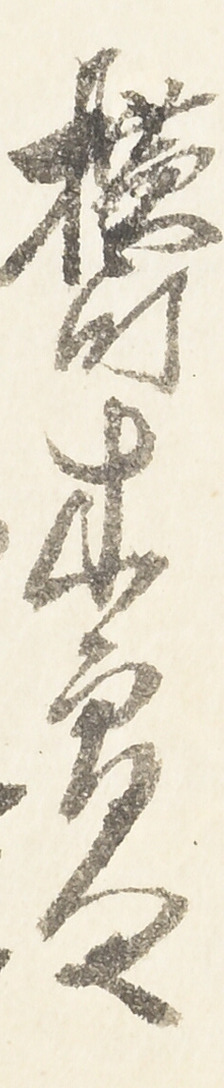横町木曽や
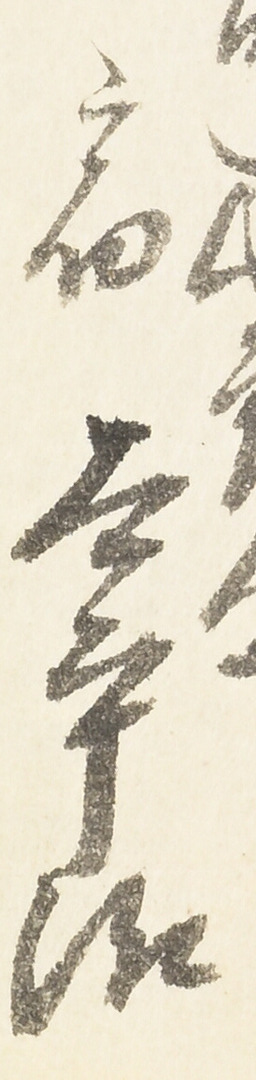宿太平治
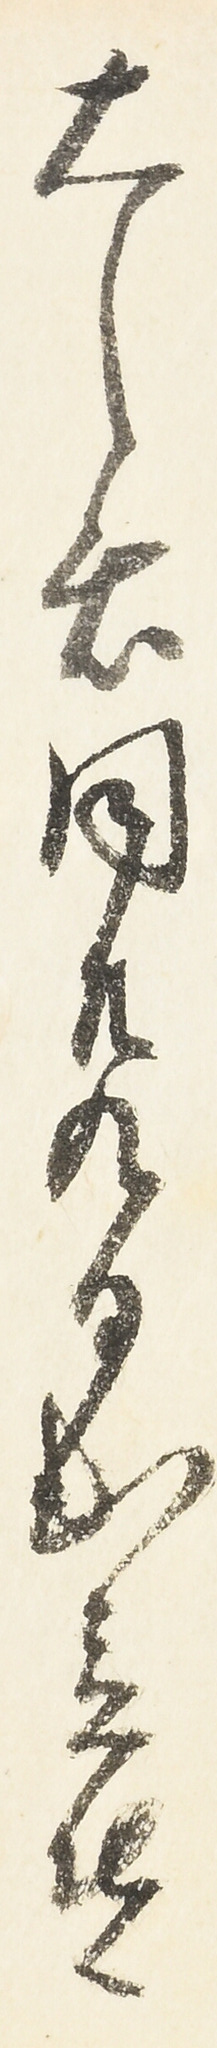右之者同廿九日出立仕候
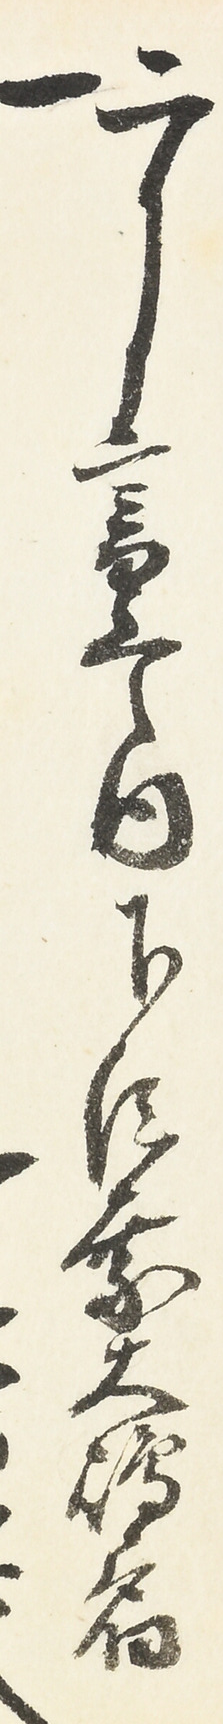二月書上之内下伊那大嶋宿
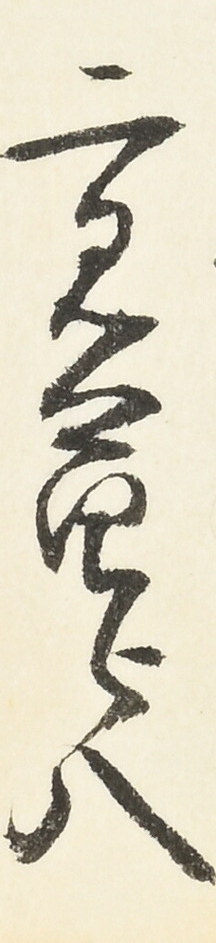一二見や四郎八
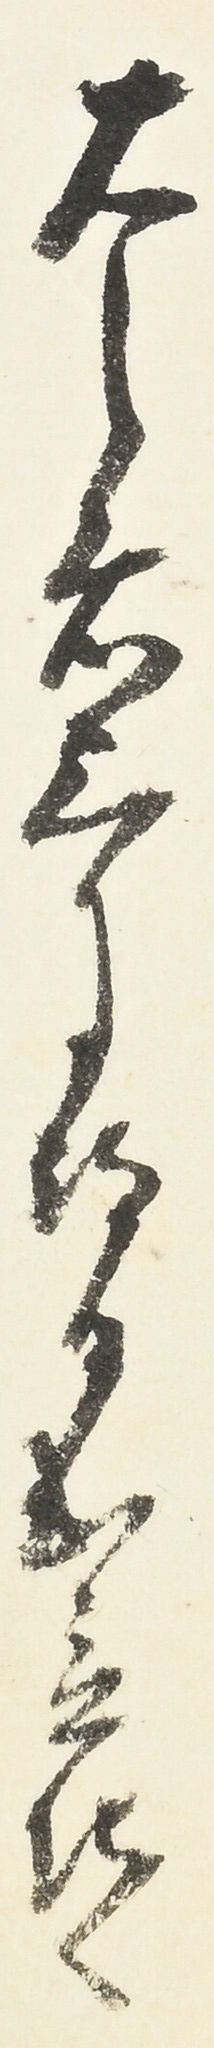右之者三月朔日出立仕候

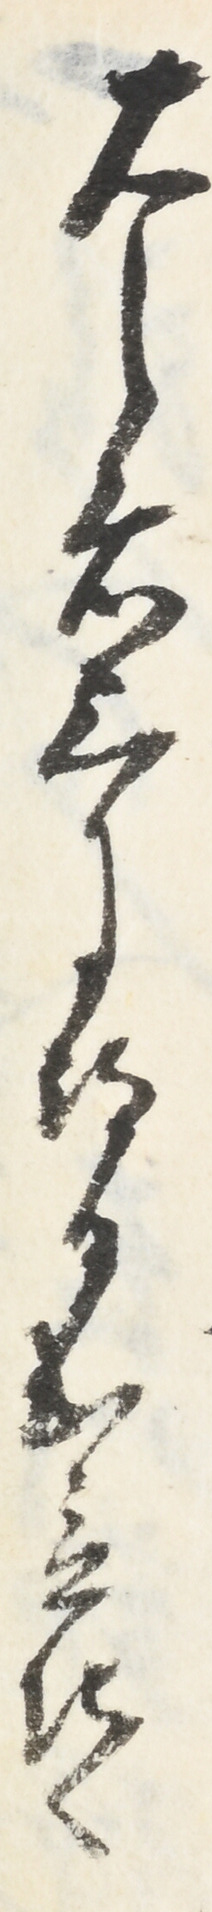右之者四月二日出立仕候
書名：町中旅人泊控帳
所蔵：伊那市立高遠町図書館・合同会社AMANE
